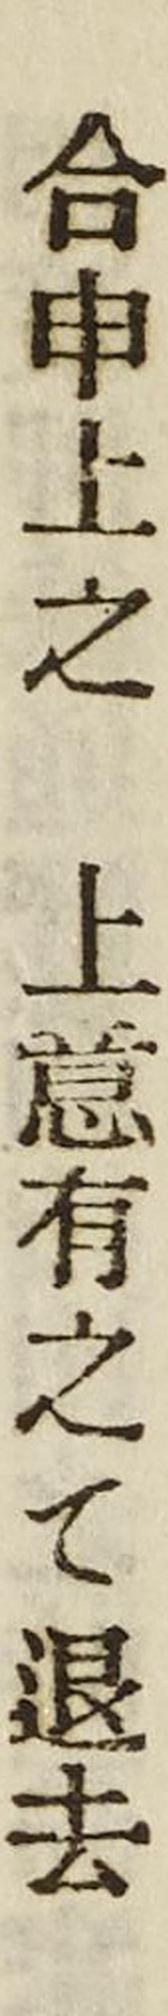合申上之上意有之て退去
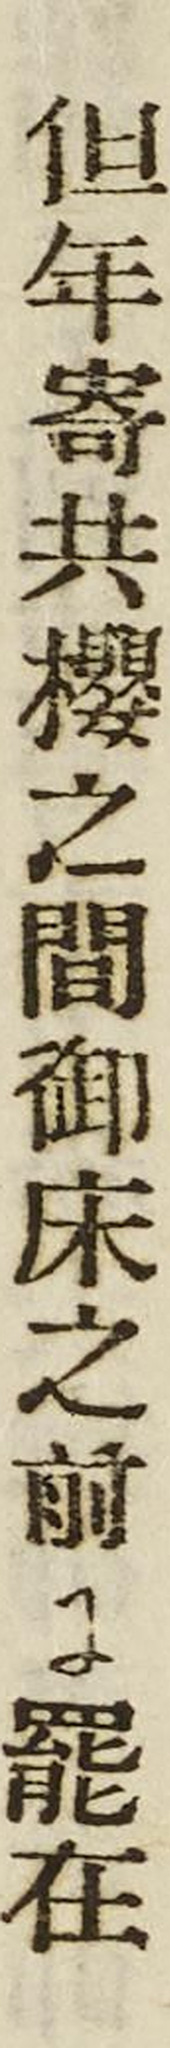但年寄共桜之間御床上前に罷在
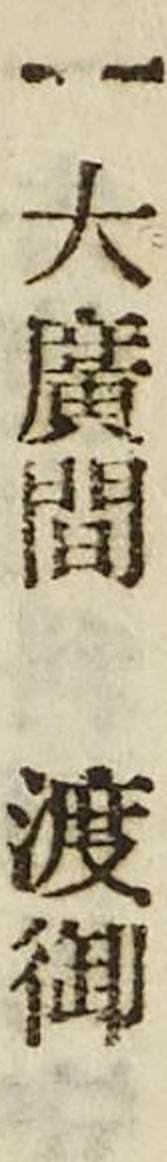一大広間渡御
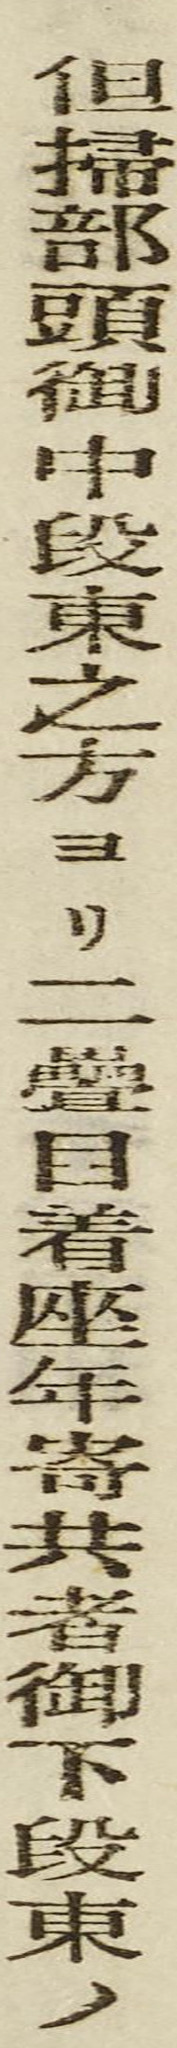但掃部頭御中段東之方ヨリ二畳目着座年寄共者御下段東ノ
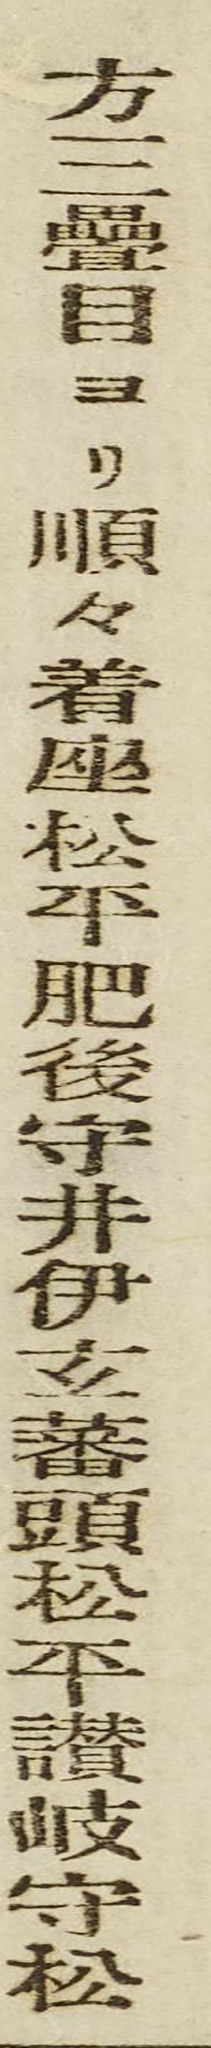方三畳目ヨリ順々着座松平肥後守井伊玄蕃頭松平讃岐守松
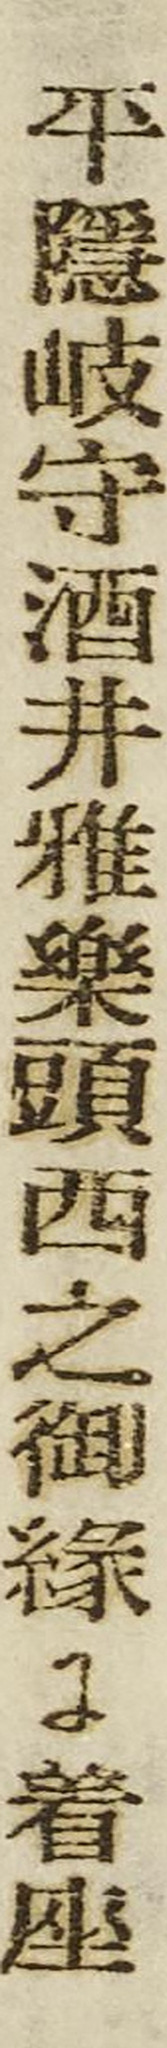平隠岐守酒井雅樂頭西之御縁に着座

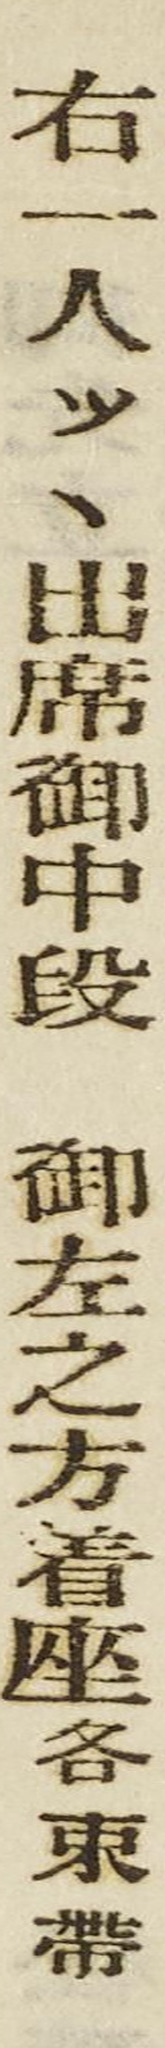右一人ツヽ出席御中段御左之方着座各束帯
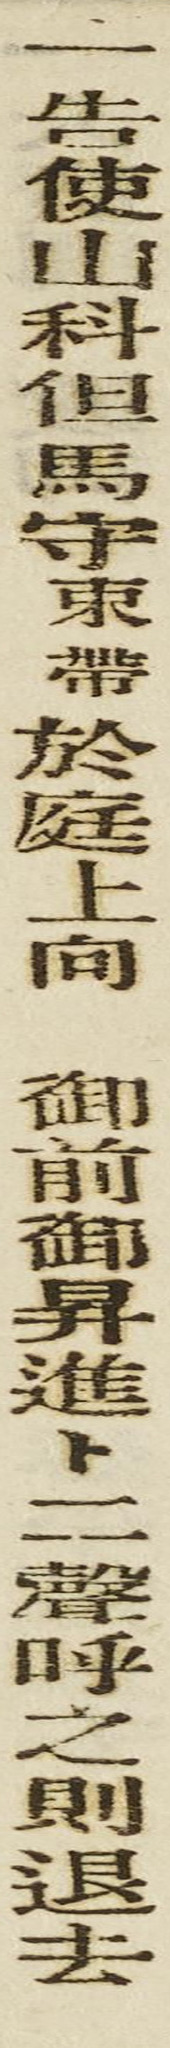一告使山科但馬守束帯於庭上向御前御昇進ト二声呼之則退去
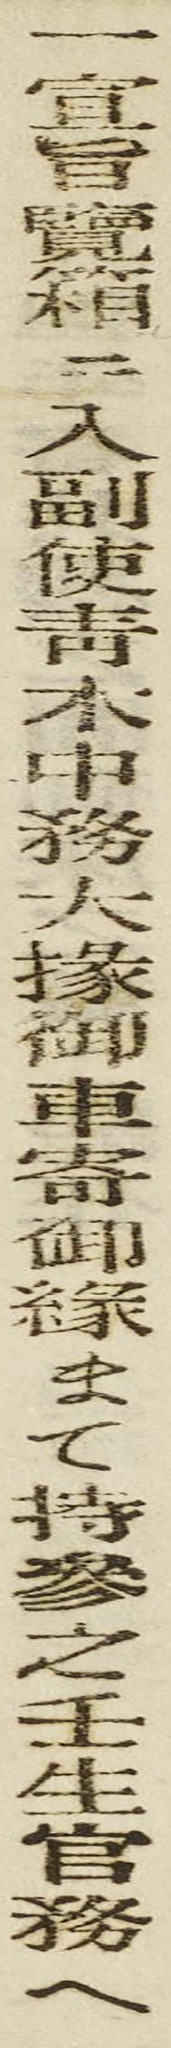一宣旨覧箱ニ入副使青木中務大掾御車寄御縁まて持参之壬生官務へ
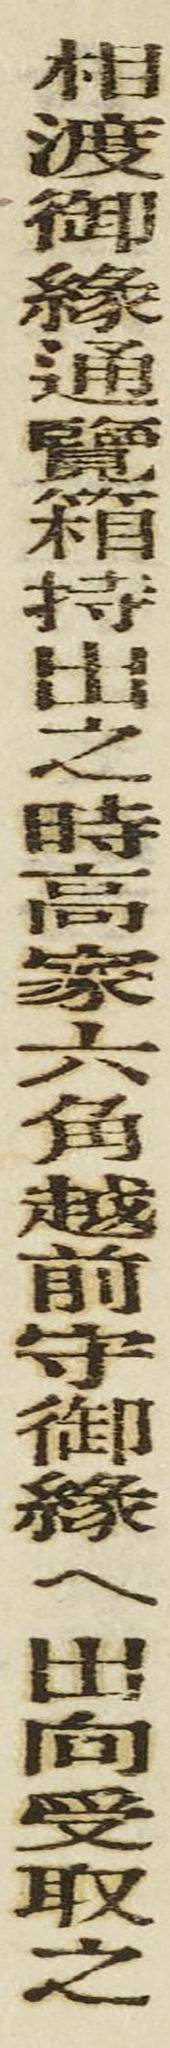相渡御縁通覧箱持出之時高家六角越前守御縁へ出向受取之
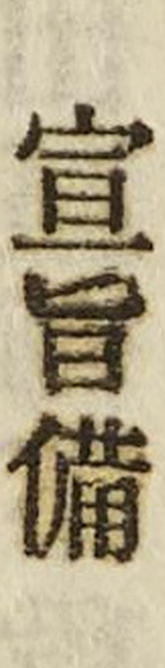宣旨備
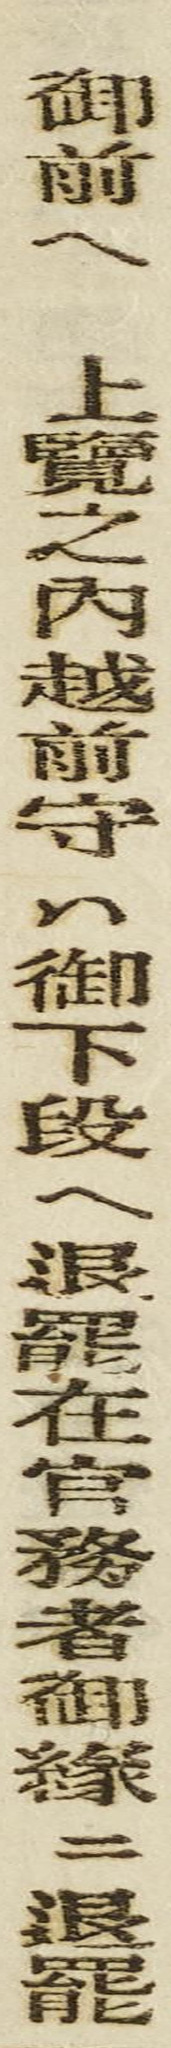御前へ上覧之内越前守は御下段へ退罷在官務者御縁ニ退罷
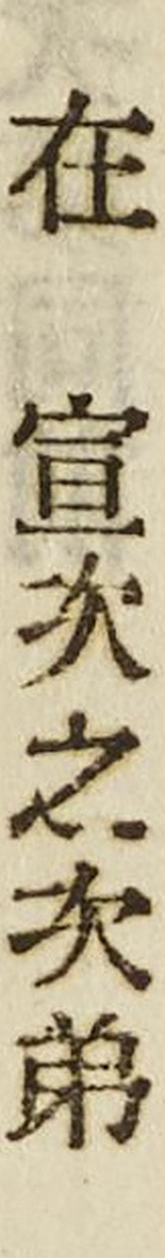在宣次之次第
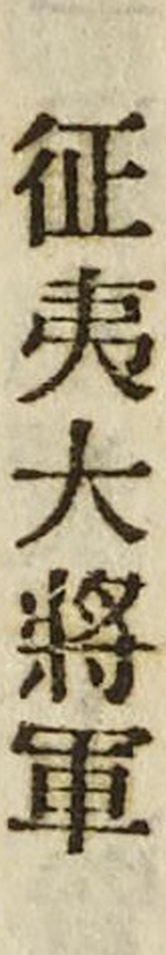征夷大将軍
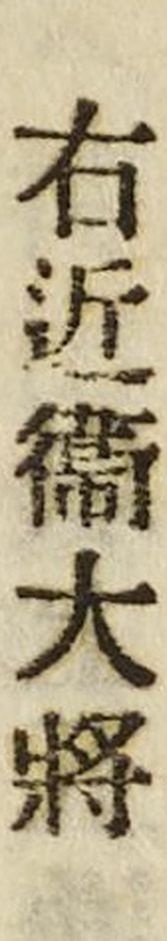右近衞大将
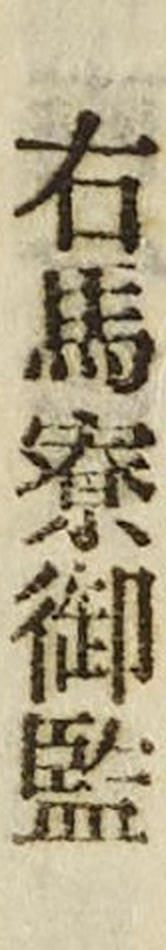右馬寮御監
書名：史籍集覽　朝鮮陣古文・細井廣澤記・颶風紀事・天明七年將軍宣下次第書　全
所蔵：東京大学地震研究所図書室 Earthquake Research Institute Library, The University of Tokyo, JAPAN
